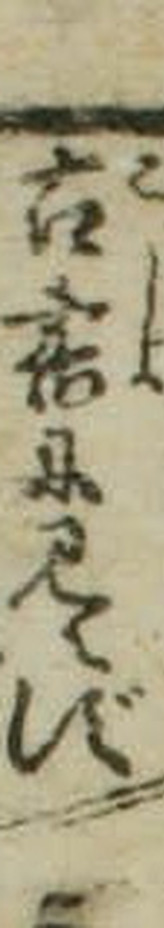古書に見えず
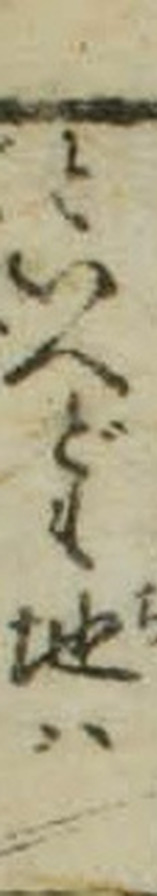といへども地は
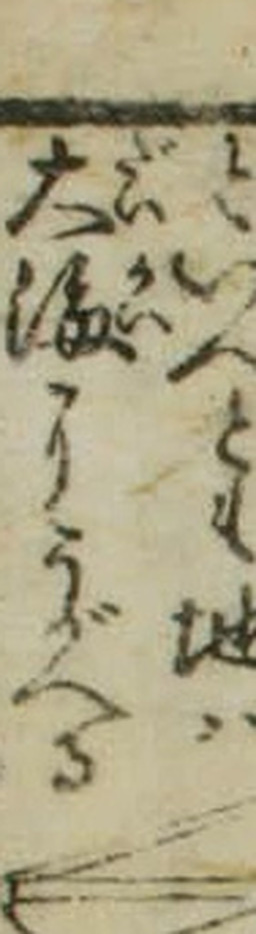大海にうかべる
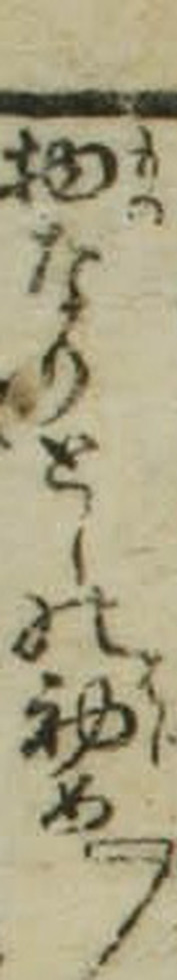物なりとしの初め
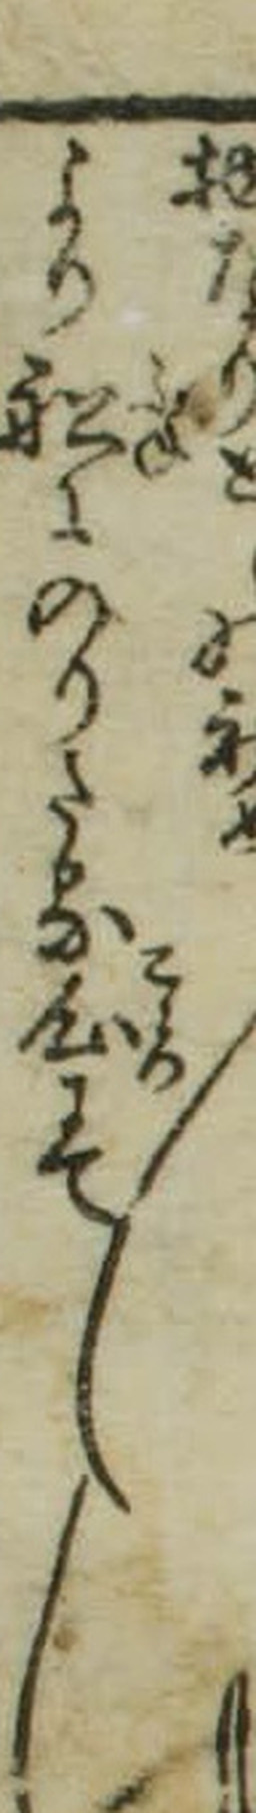より船にのりたる心にて
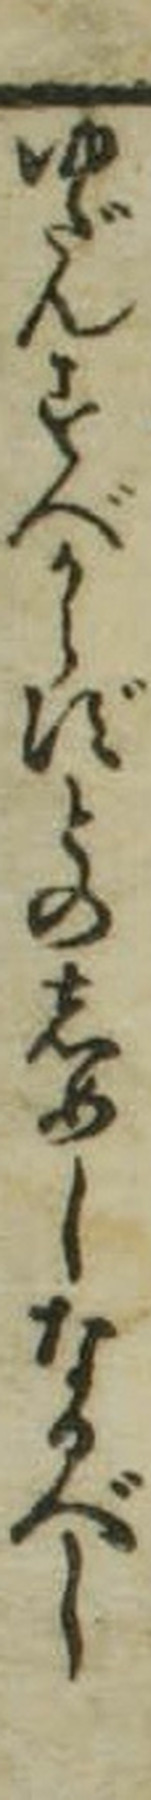ゆだんすべからずとのしめしなるべし

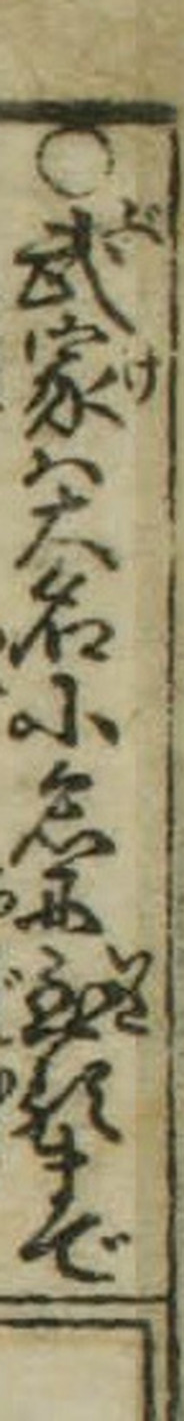〇武家は大名小名に至るまで
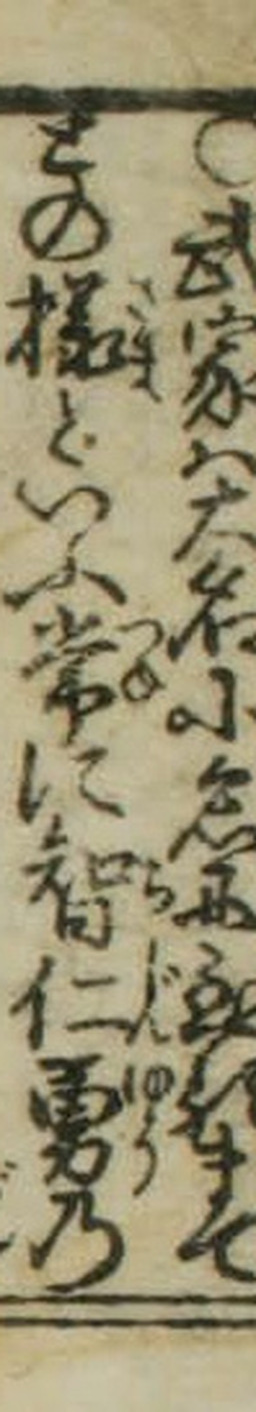との様といふ常に智仁勇の
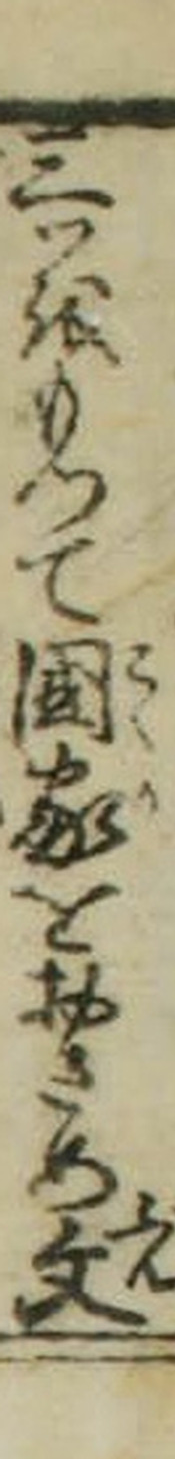三つをもつて国家をおさめ文
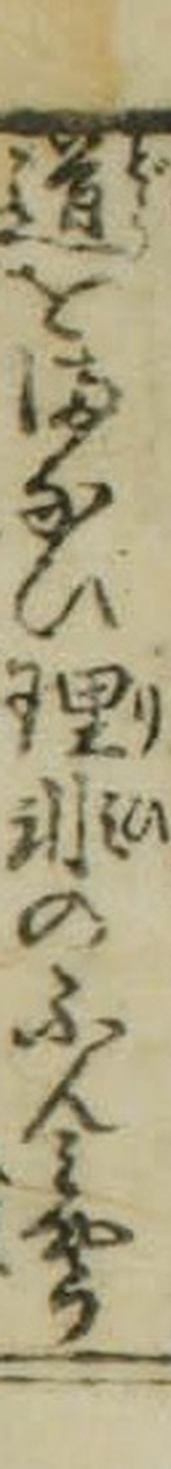道をまなひ理非のふんみやう
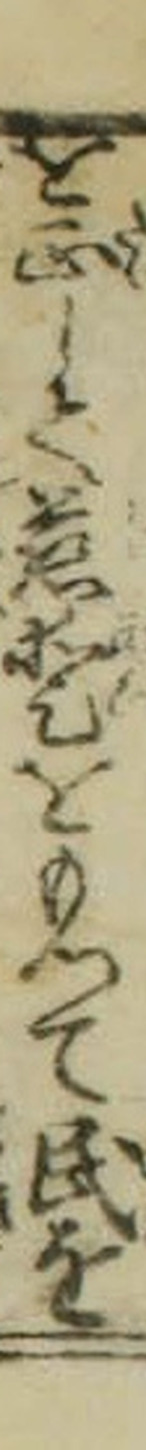を正して慈愛をもつて民を
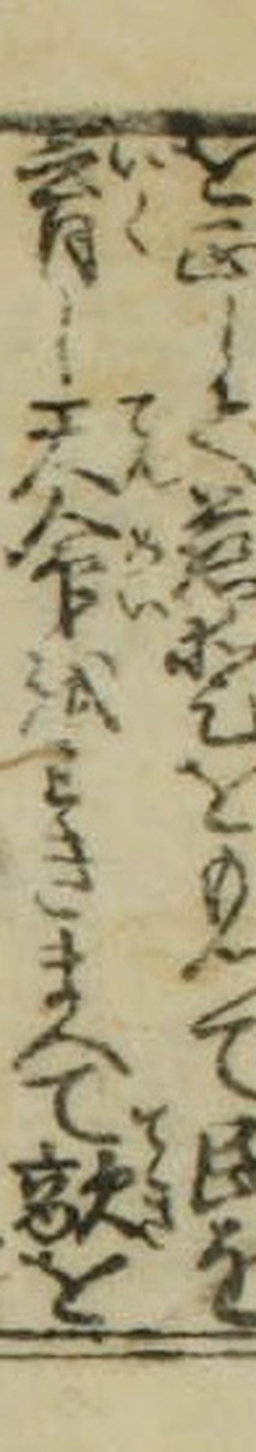育し天命をわきまへて敵を
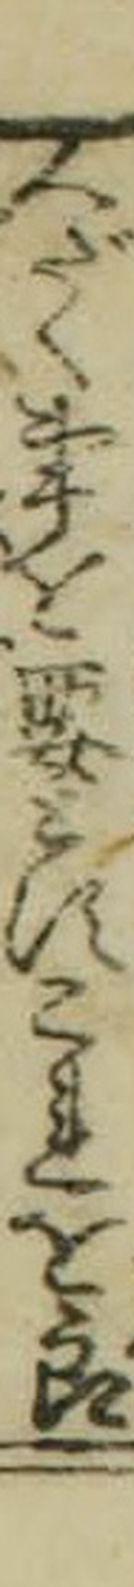くだく事を要とすこれを良
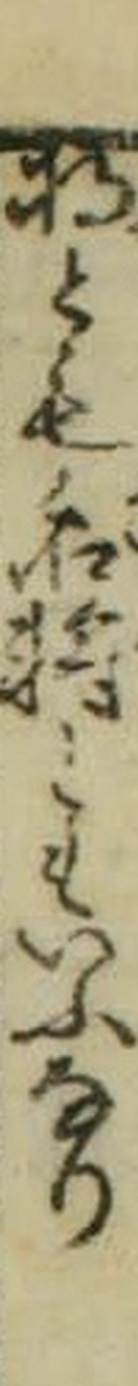将とも名将ともいふなり
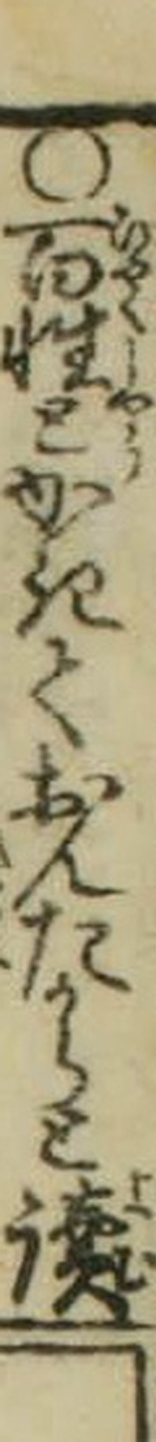〇百姓とかきておんたからと読
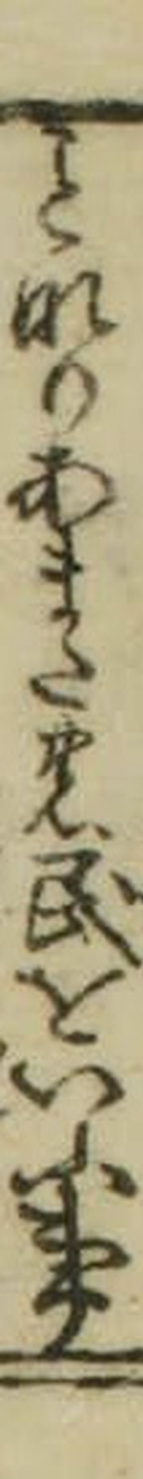ことなりあまたの民をいふ事
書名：増補職人往来
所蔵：東京学芸大学教育コンテンツアーカイブ
